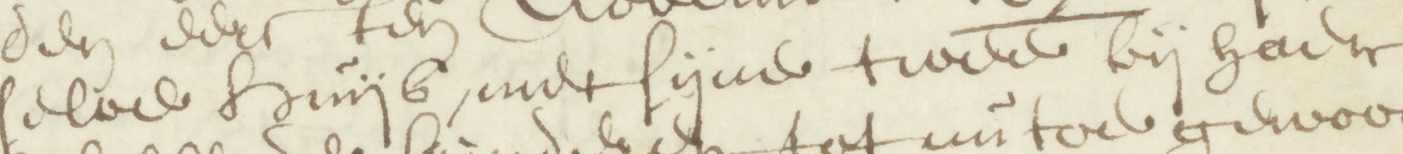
selve Huijs, met sijne twee bij haer
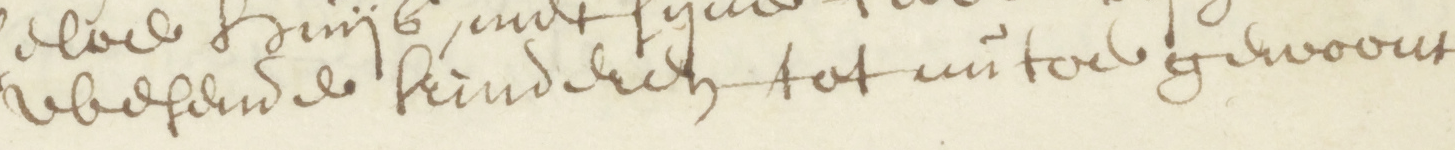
wesende kinderen tot nutoe gewoont
